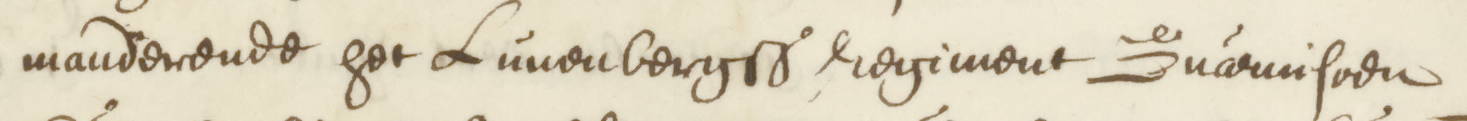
„manderende het Lunenbergs regiment Guarnisoen
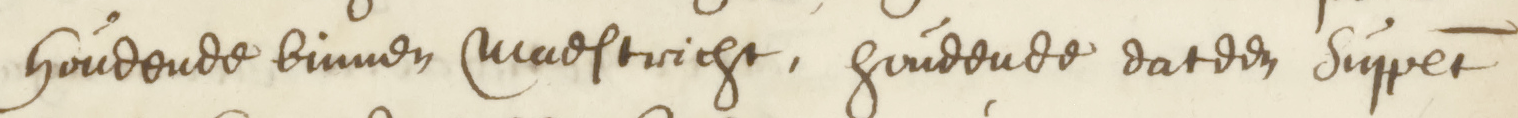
houdende binnen maestricht, houdende dat den Supplt
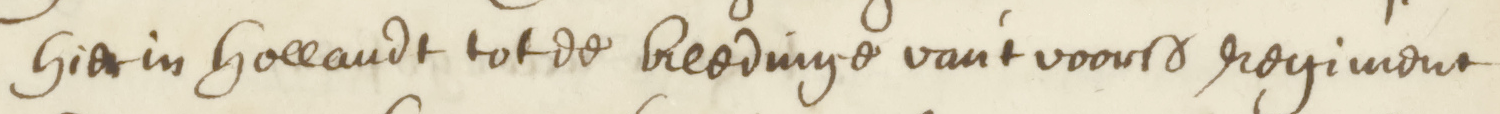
hier in hollandt tot de kledinge van‛t voors regiment
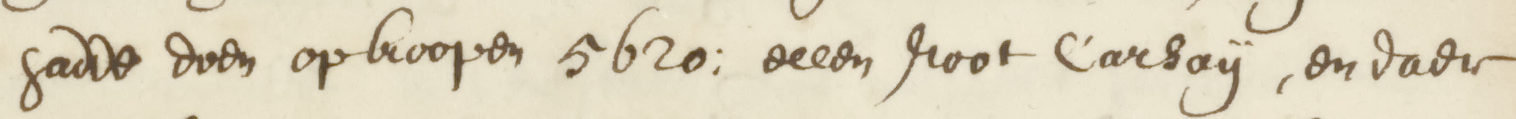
hadde doen opkoopen 5620: ellen root Carsaij, en daer
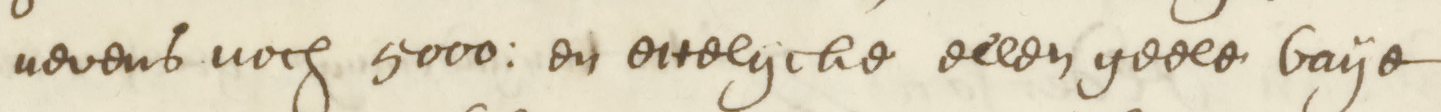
nevens noch 5000: en ettelijcke ellen geele baije
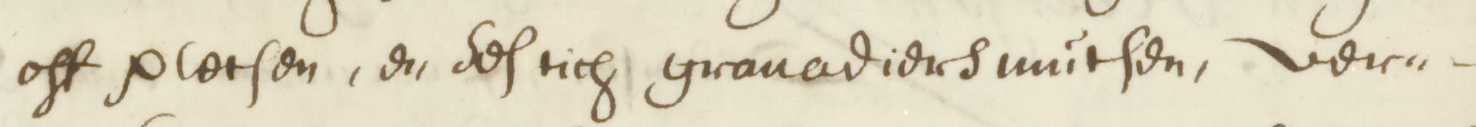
off pletsen, en sestich granadiersmutsen, ver„
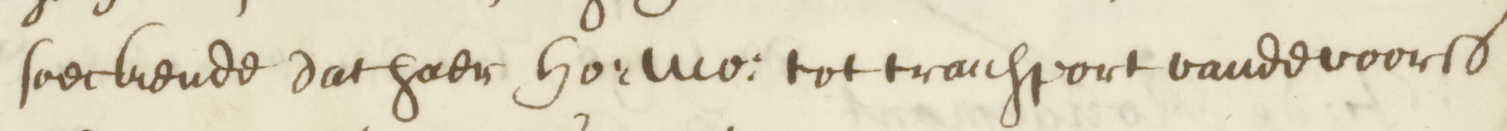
soeckende dat haer Ho:Mo: tot transport vande voors
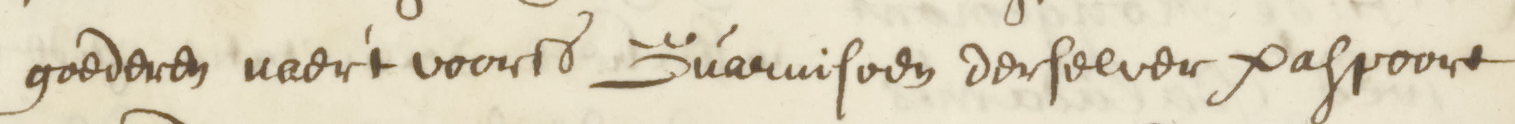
goederen naer‛t voors Guarnisoen derselver paspoort
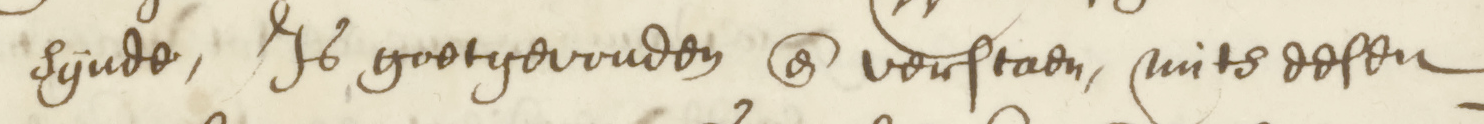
sijnde, Is goetgevonden en verstaen, mits desen
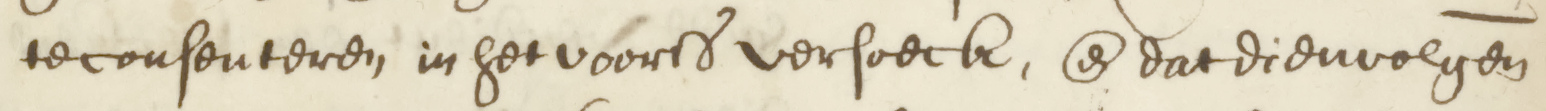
te consenteren in het voors versoeck, en dat dienvolgen
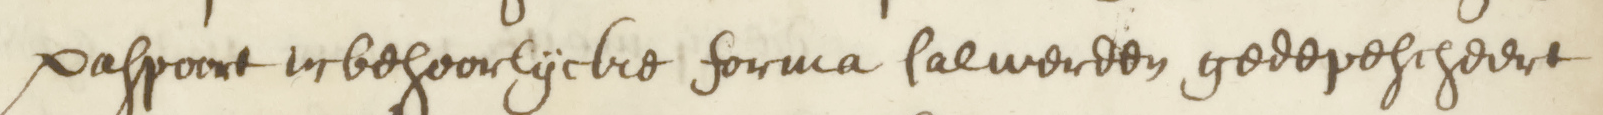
paspoort in behoorlijcke forma sal werden gedepescheert
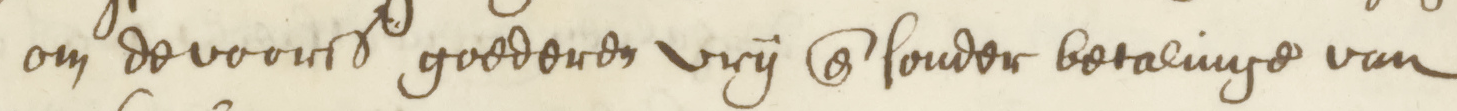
om de voors goederen vrij en sonder betalinge van
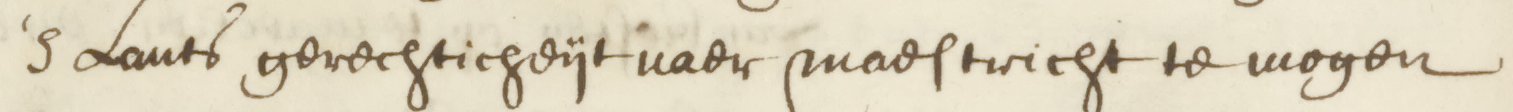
‛s Lants gerechticheijt naer maestricht te mogen
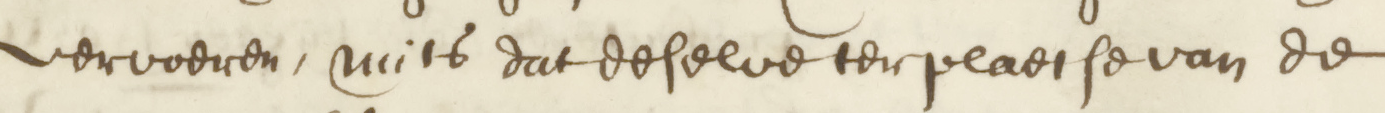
vervoeren, mits dat deselve ter plaetse van de
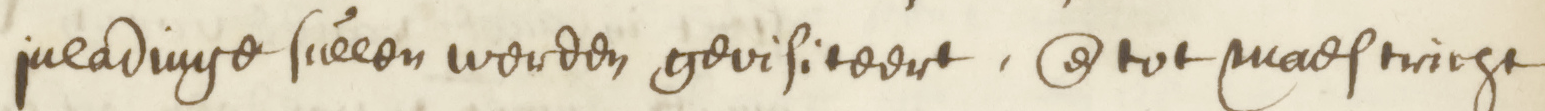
inladinge sullen werden gevisiteert, en tot maestricht
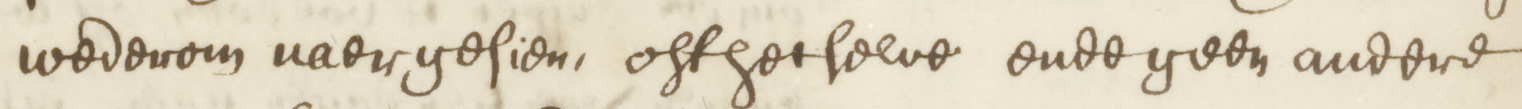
wederom naergesien, off hetselve ende geen andere
